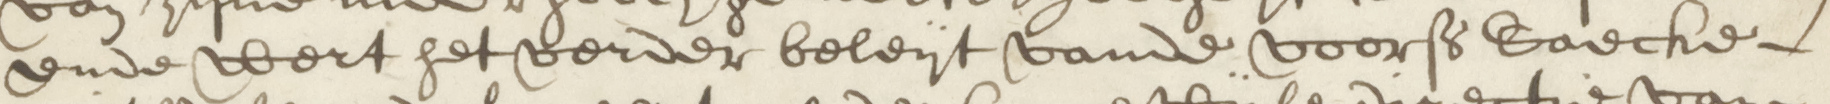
ende wert het verder beleijt van de voorsz Saecke —
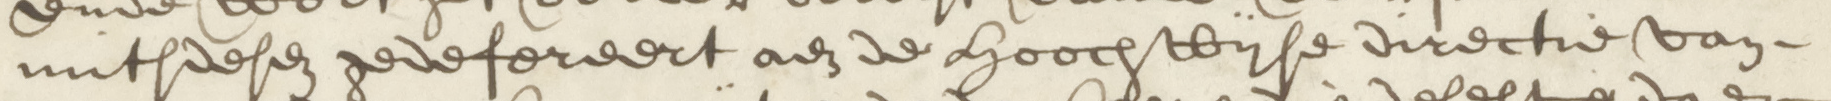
mitsdesen gedefereert aen de Hoochwijse directie van —
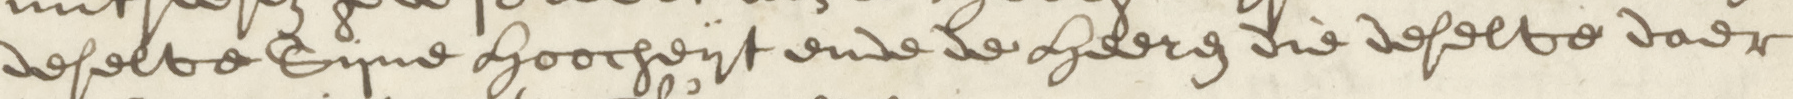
deselve Sijne Hoocheijt ende de Heeren die deselve daer
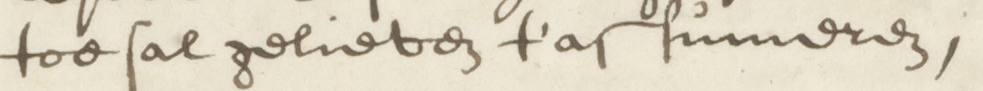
toe sal gelieven t‛assumeren.
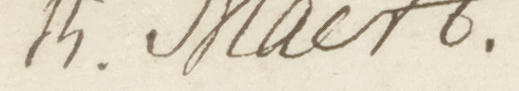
15 Maert.
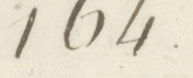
164
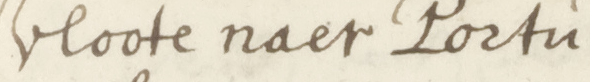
Vloote naer Portu
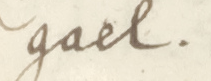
gael.
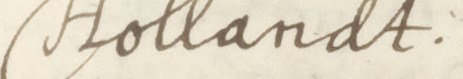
Hollandt.
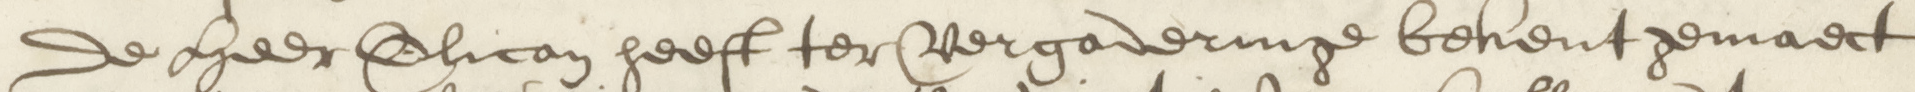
De Heer Olican heeft ter Vergaderinge bekent gemaect
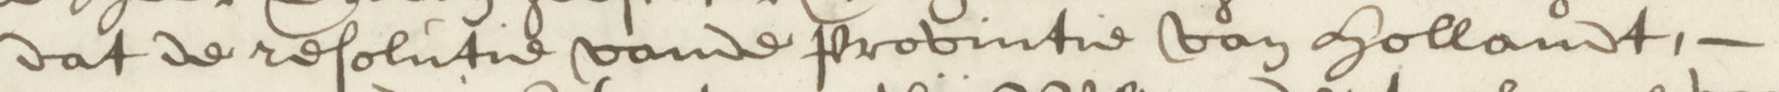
dat de resolutie van de Provintie van Hollandt, —
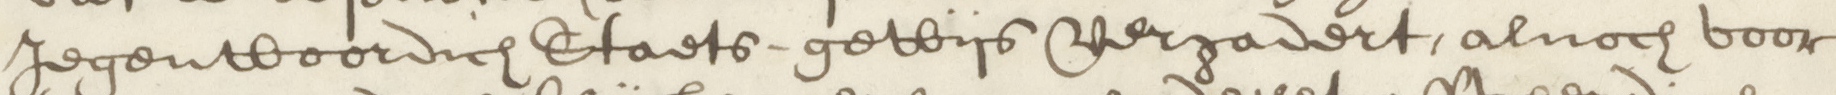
Jegenwoordich Staets gewijs Vergadert, alnoch voor
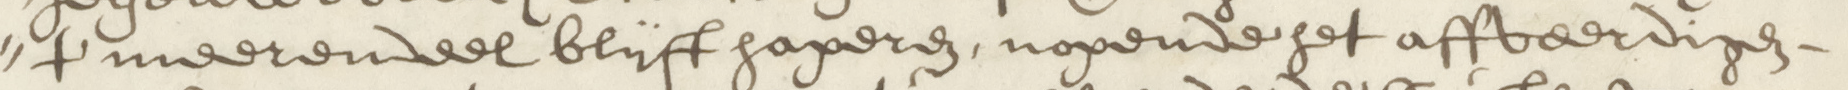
t‛meerendeel blijft haperen, nopende het affveerdigen —
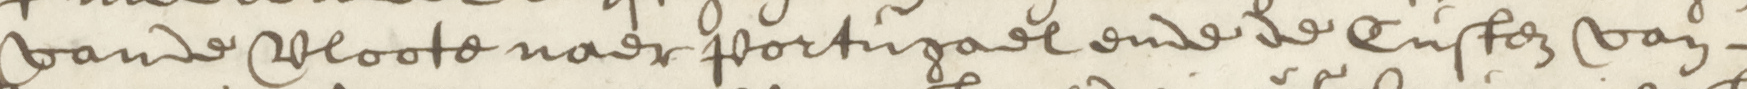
van de Vloote naer Portugael ende de Custen van —
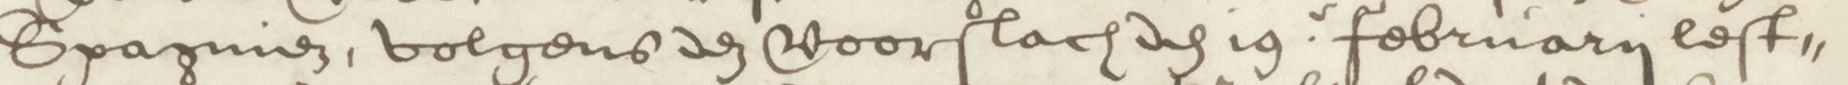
Spagnien, volgens den voorslach den 19e Februarij lest„
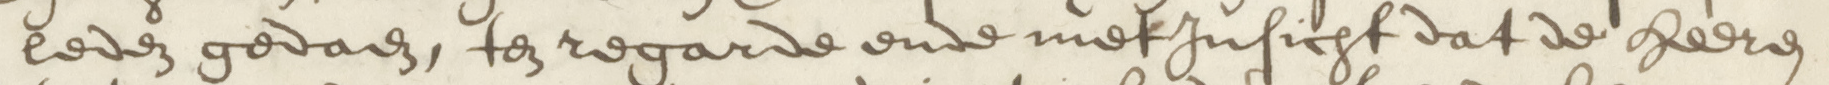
leden gedaen, ten regarde ende met Insicht dat de Heeren
